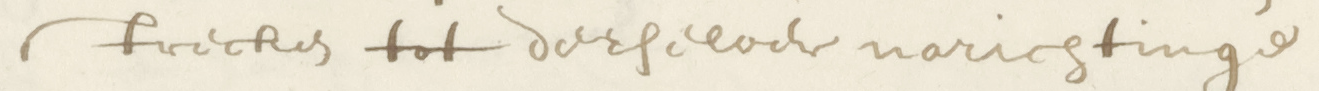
strecken tot derselver narichtinge.
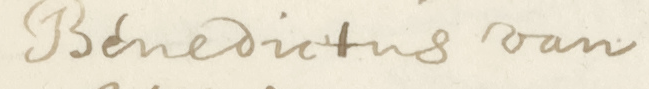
Benedictus van
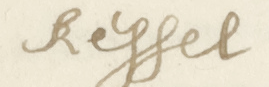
Kessel.
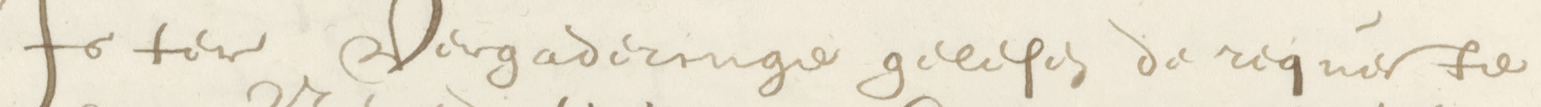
Is ter Vergaderinge gelesen de requeste
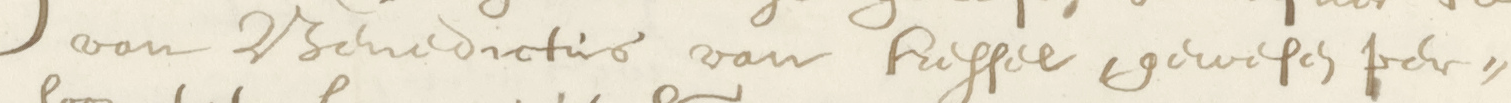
van Benedictus van Kessel, gewesen per„
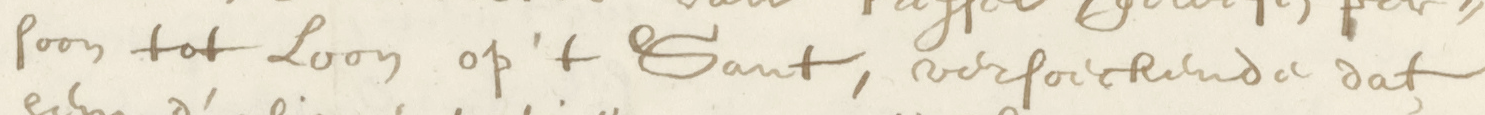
soon tot Loon op 't Sant, versoeckende dat
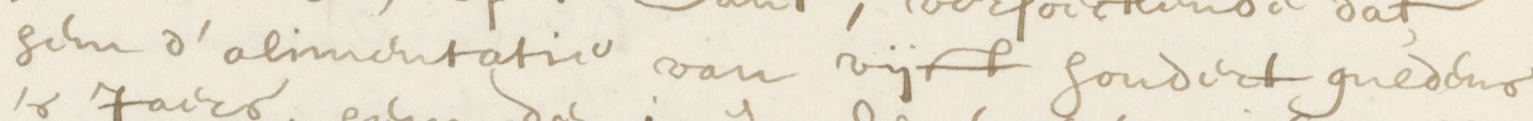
hem d'alimentatie van vijff hondert guldens
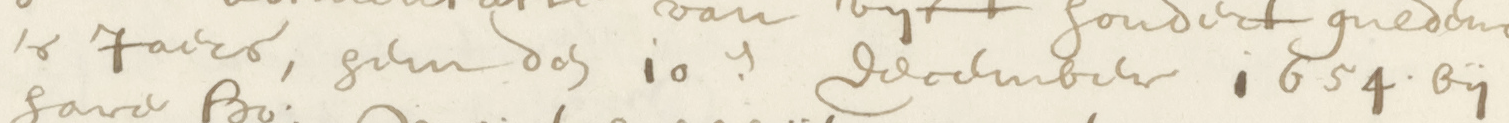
‛s Jaers, hem den 10e. December 1654. bij
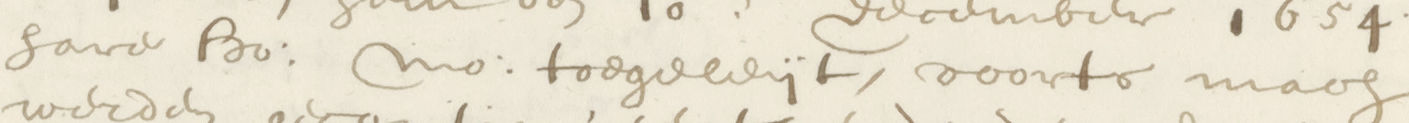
hare Ho:Mo: toegeleijt, voorts mach
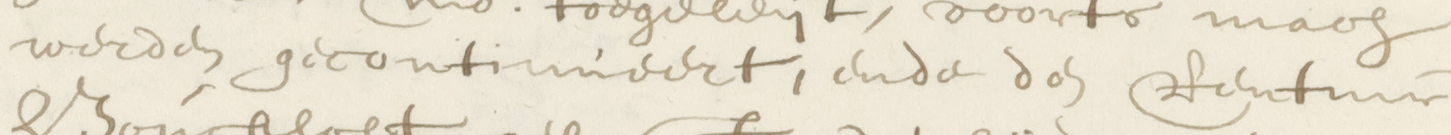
werden gecontinueert, ende den Rentmr
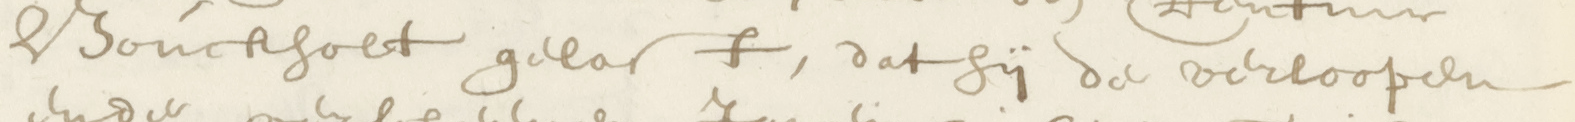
Bouckholt gelast, dat hij de verloopen
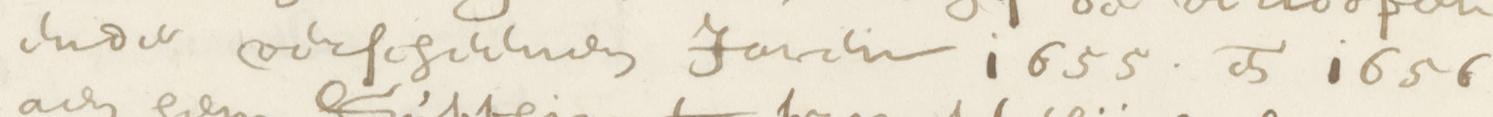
ende verscheenen Jaren 1655. & 1656.
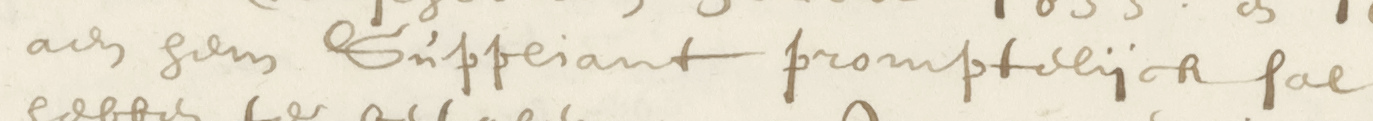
aen hem Suppliant promptelijck sal
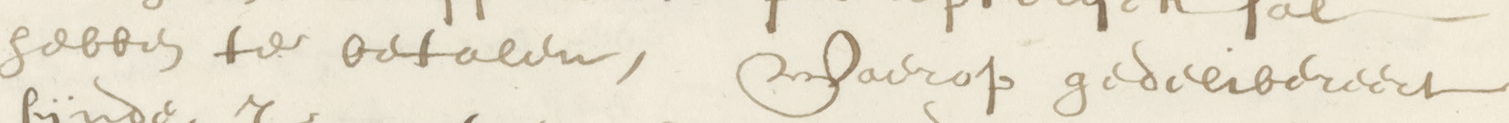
hebben te betalen. Waerop gedelibereert
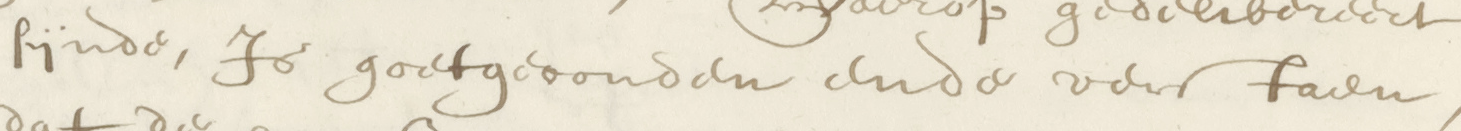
sijnde, Is goetgevonden ende verstaen,
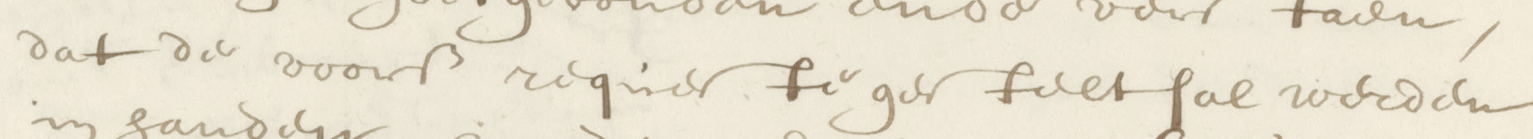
dat de voors requeste gestelt sal werden
